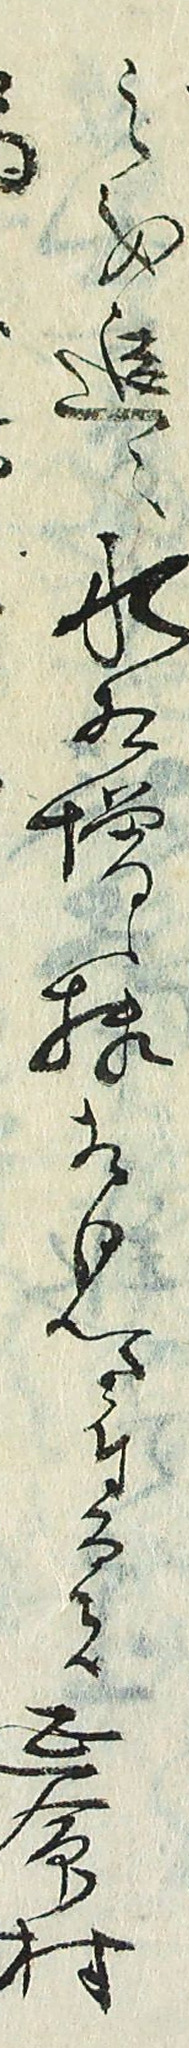之義追々水相増候様相見候に付ては延命村
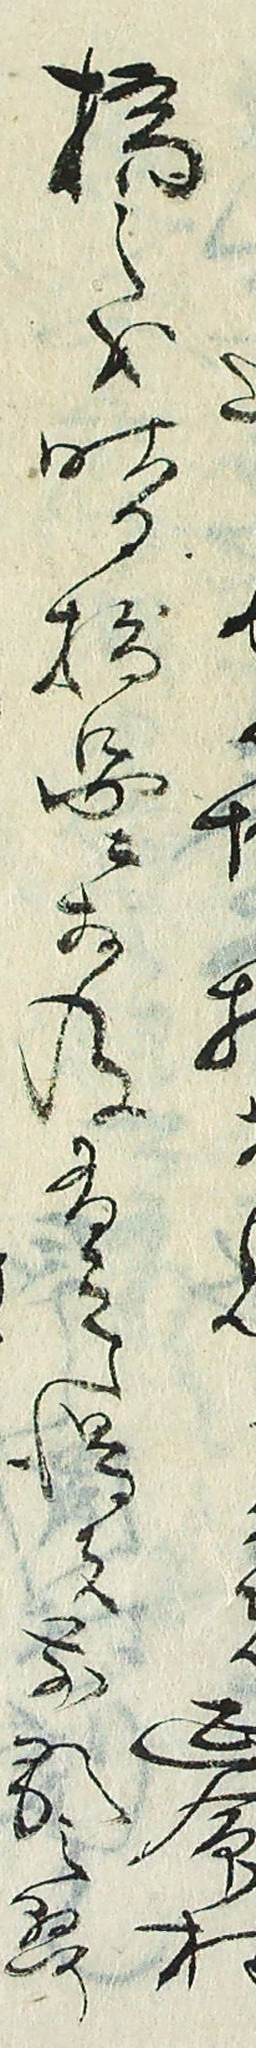橋之義昨日指図に相及有之候得は前顕之懸り
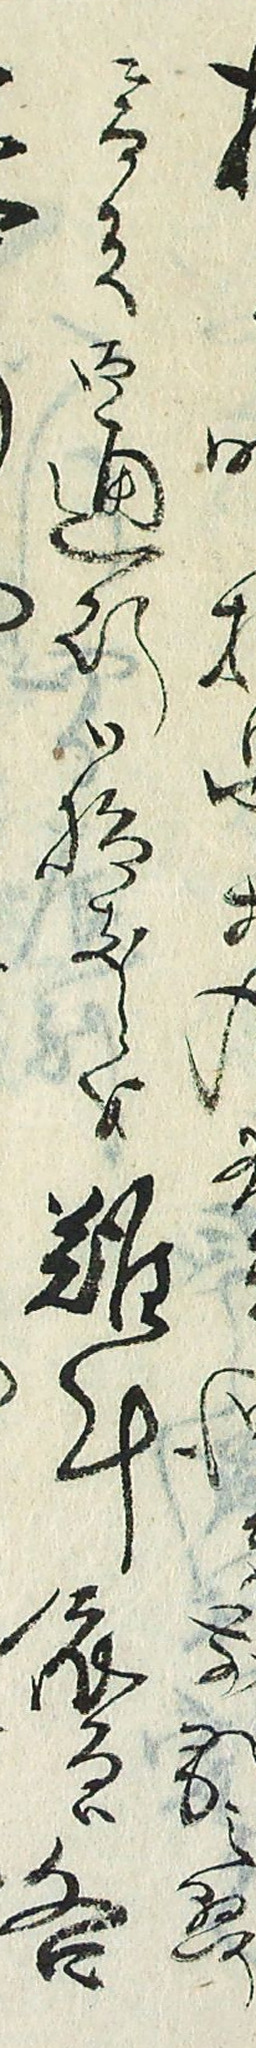にては御通工御指支之義難計依ては各
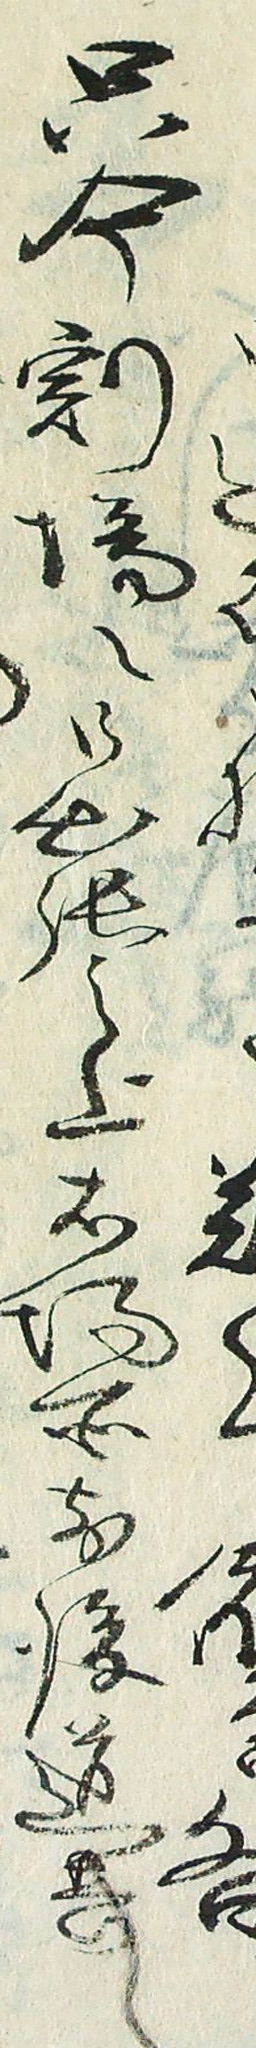只今割場々御出張之上右場所前後道共
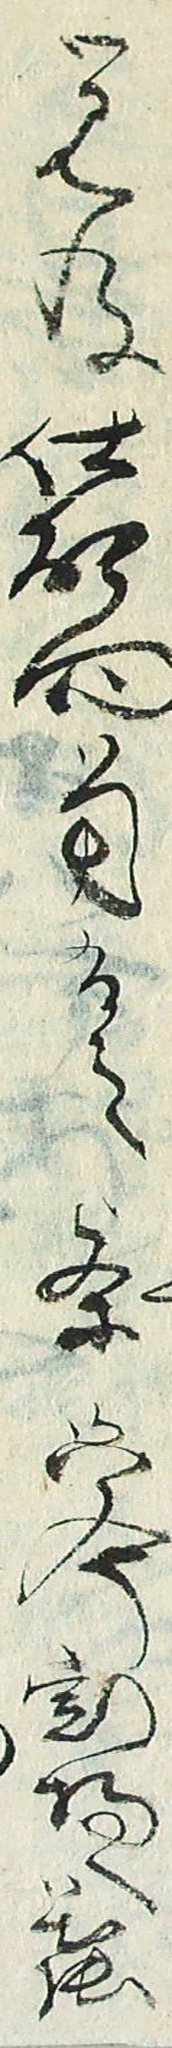御見及仕配向御用有之候条只今割場へ御出張
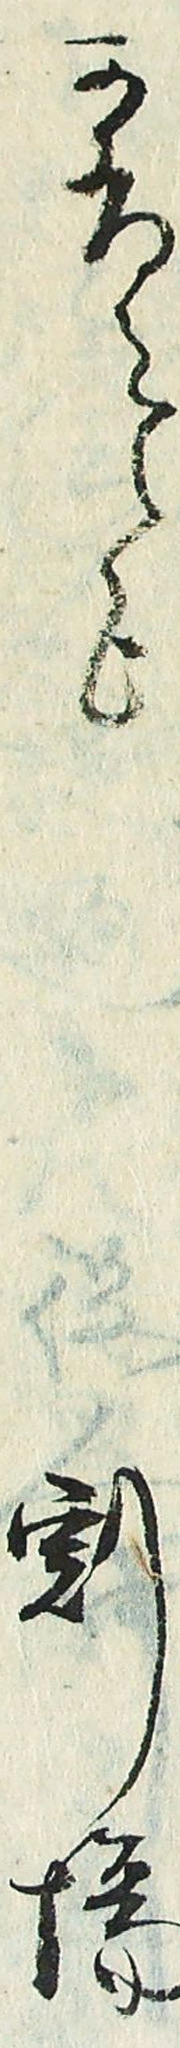可有之候以上割場
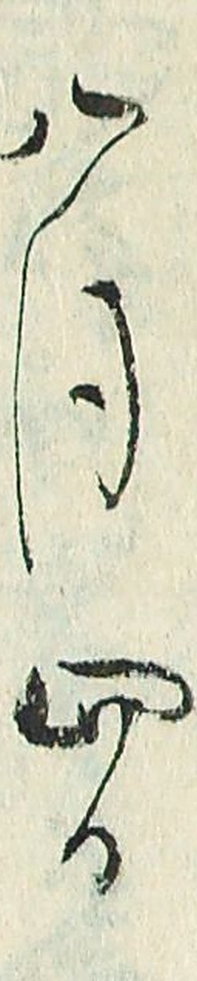八月四日

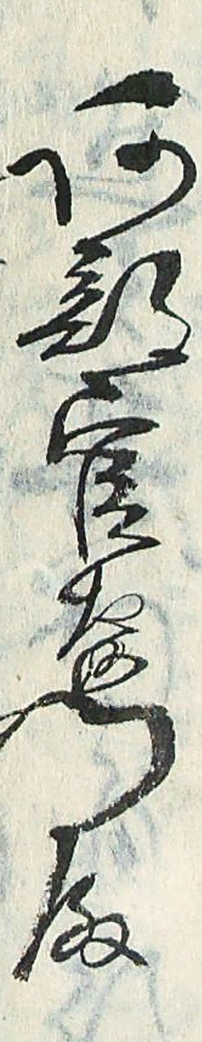阿部官左衛門殿
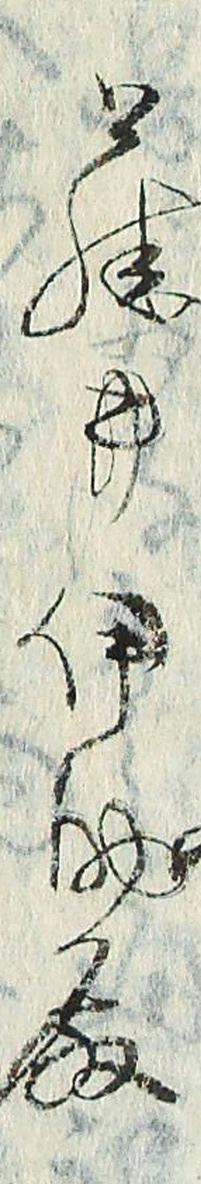藤井伊助殿
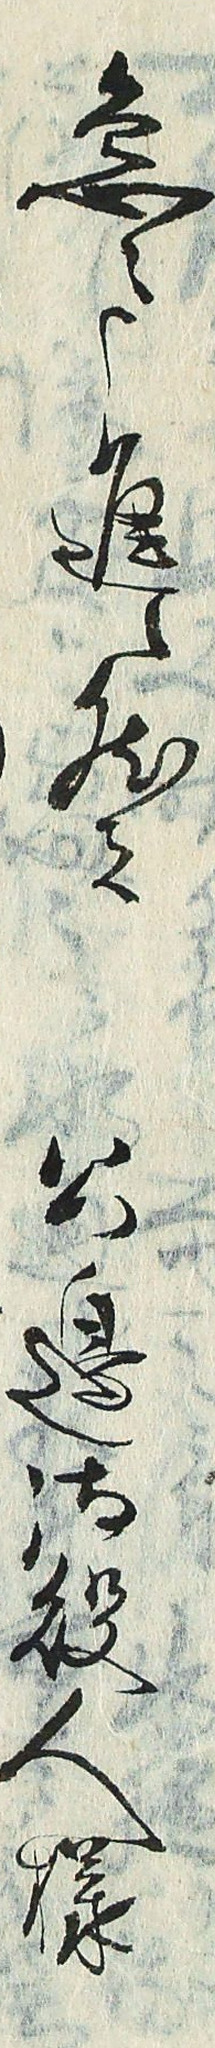急々申進候然は公辺御役人様
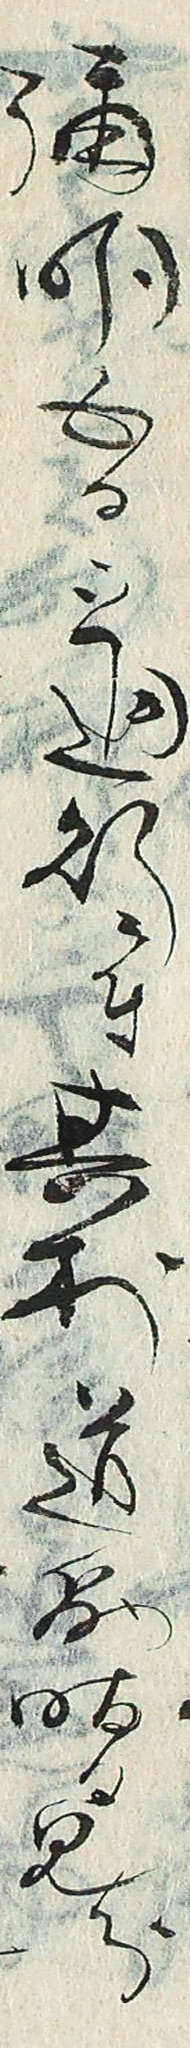弥明五日御通行に付其村道筋昨日見分
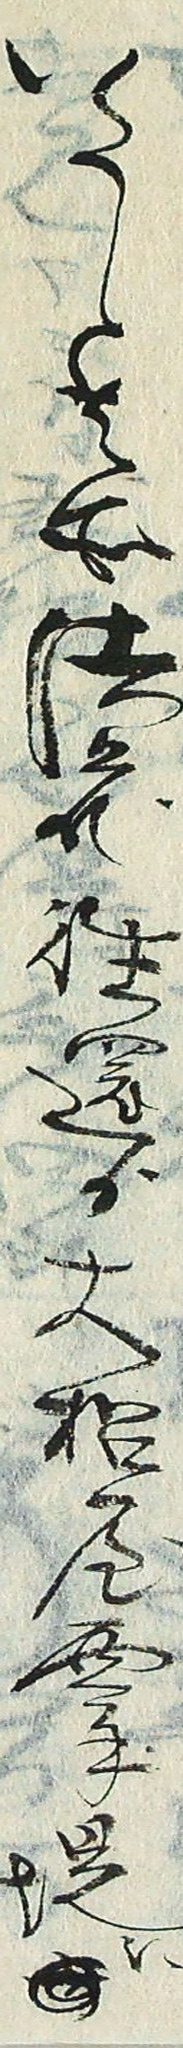いたし候所法花往還ゟ大梠屋西手堤え
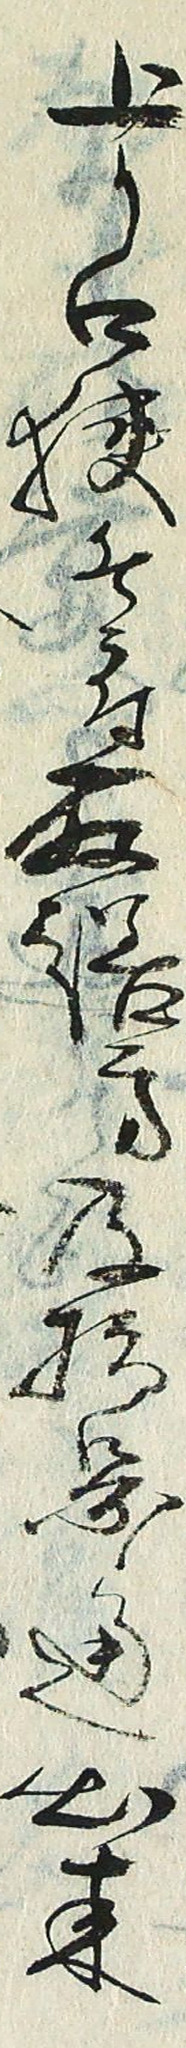上り口狭候に付取繕方及指図候通出来
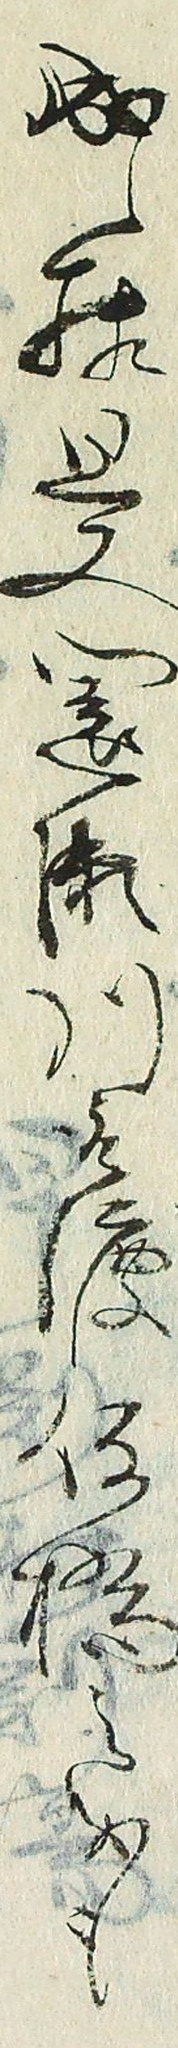成し候様且又園瀬川取渡仮橋之義も
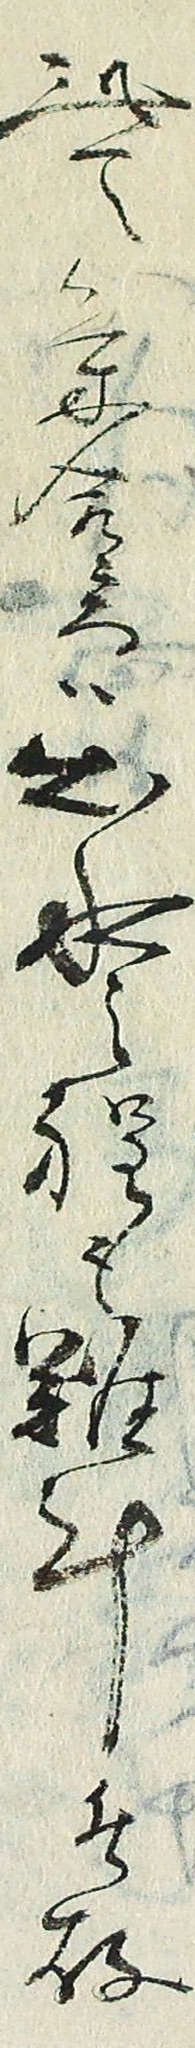此天気合にては出水之程も難計候故
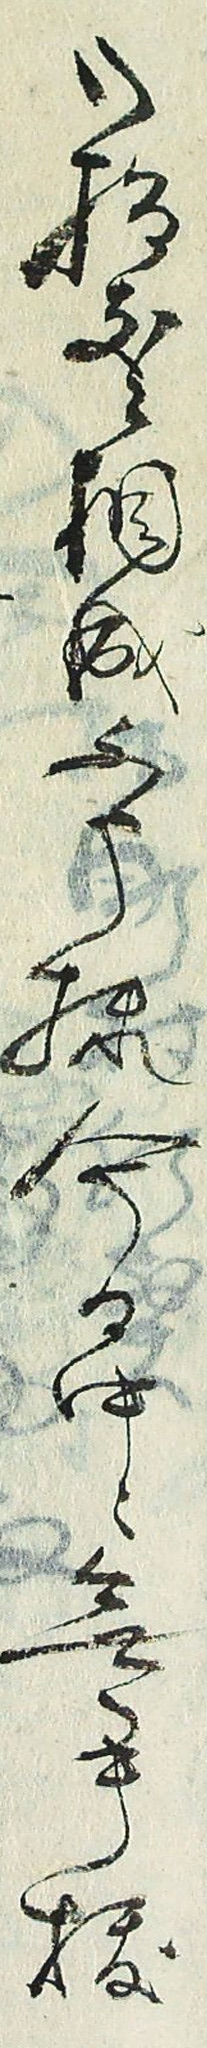御指支に相成不申様今日中に無手抜
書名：公辺御役人為御廻浦御立越諸御用一巻
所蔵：鳴門教育大学 Naruto University of Education
